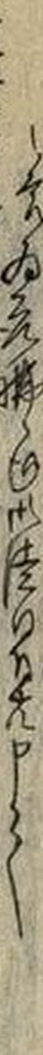之節為取払候趣御徒目付共申之

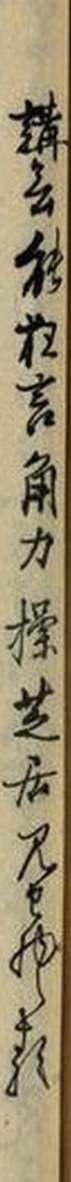講会能狂言角力操芝居見セ物之類
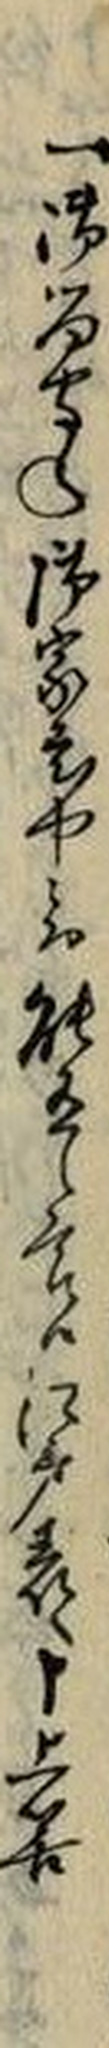一御留守年御家老中にて能有之節は江戸表へ申上筈
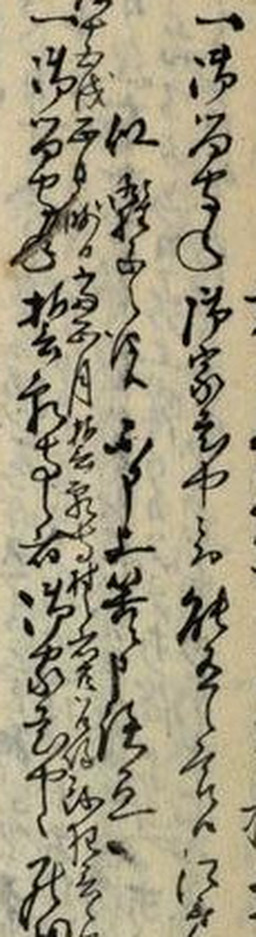但囃子之儀は不申上筈に申談置
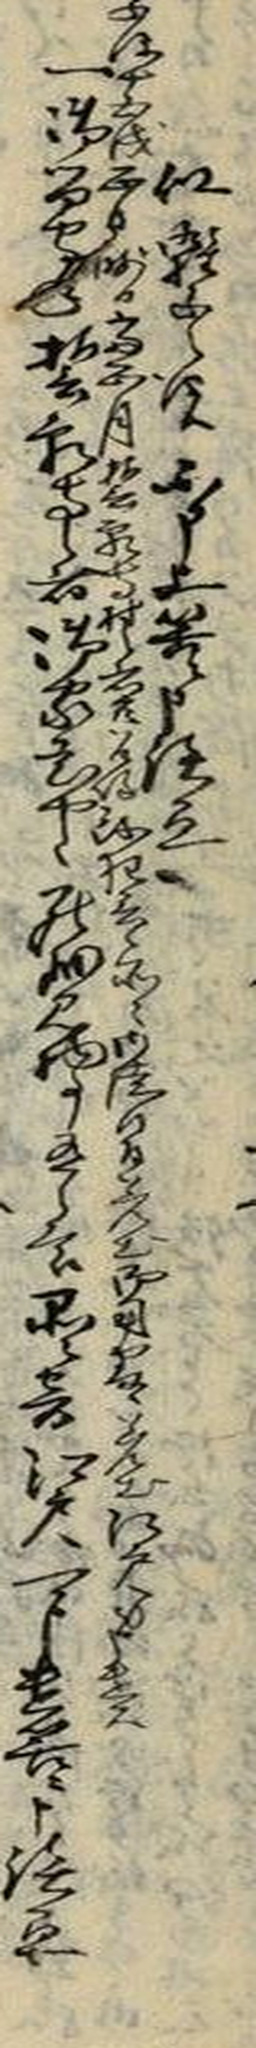一御留守年誓願寺之者御家老中へ罷越見物事有之節品に寄江戸へ可申遣筈に申談置
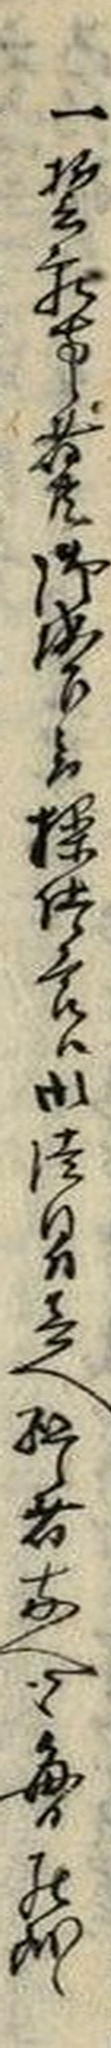一誓願寺之者共御城下にて操仕候節は御徒目付壱人組之者両人ツヽ毎日罷越候
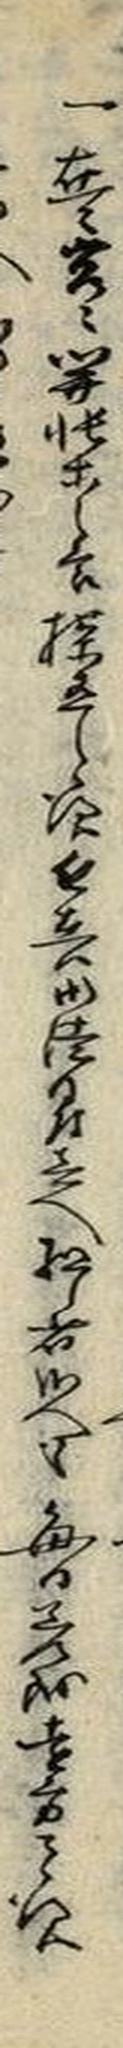一在々宮々開帳等之節操有之候得は近在は御徒目付壱人組之者弐人ツヽ毎日差越遠方に候得は
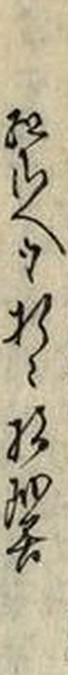組弐人ツヽ折々指越筈
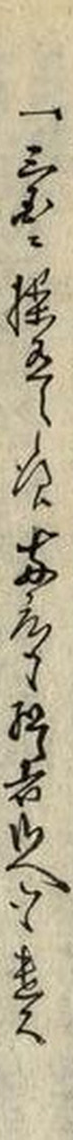一三国に操有之候得は両度とも組之者弐人ツヽ遣ス
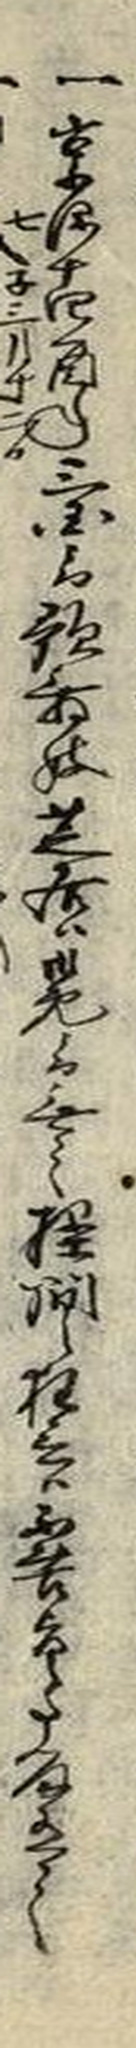一享保十四酉年三国にて歌舞妓芝居は御免にて無之操間之狂言は不苦旨之事留有之
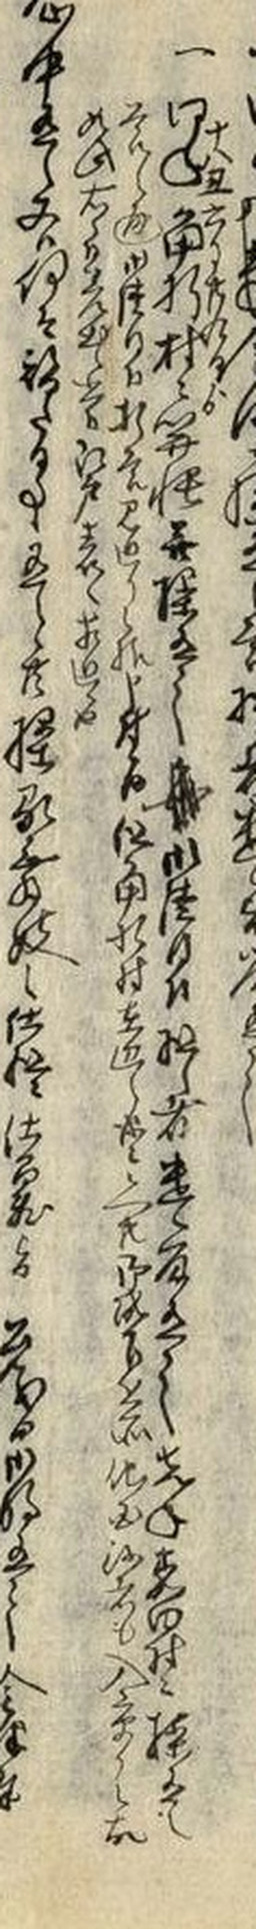節之通御徒目付折節見廻り候様申付候但角折村在辺之儀に候へ共御城下近所他国役者も入交り候故
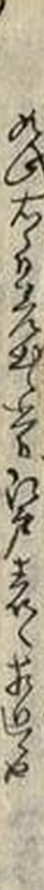如此右に付差出候書付江戸表へ相廻候由
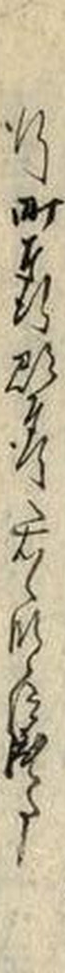行町奉行郡奉行へ右之段被仰渡候事
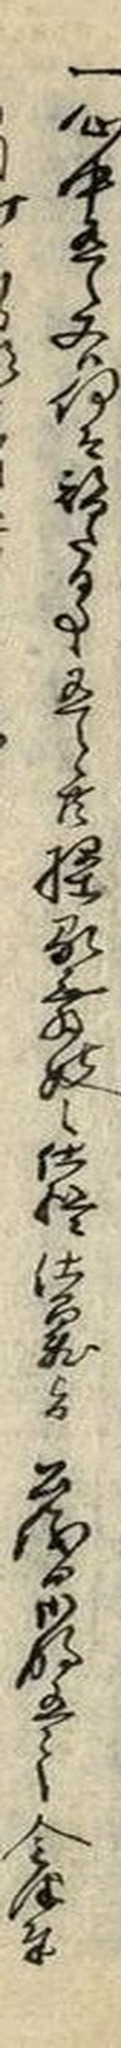一心中有之又は何そ替たる事有之候共操歌舞妓之仕組ミ仕間敷旨公儀ゟ御触有之金津奉
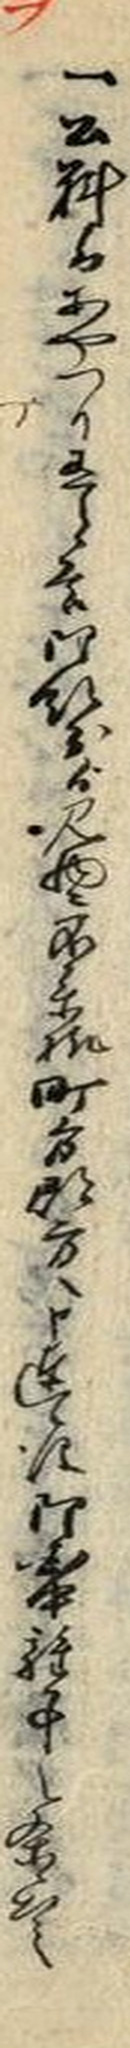一公料にてあやつり有之候節御領分ゟ見物に不参様町方郡方へ申達候儀御国中雑事之条出之

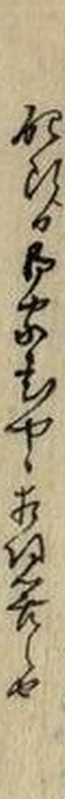配頭ゟ御家老中へ相伺筈候也
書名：御城下諸事之部
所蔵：福井県文書館 Fukui Prefectural Archives
